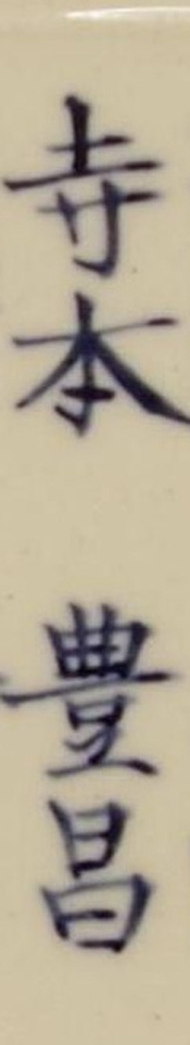寺本豊昌
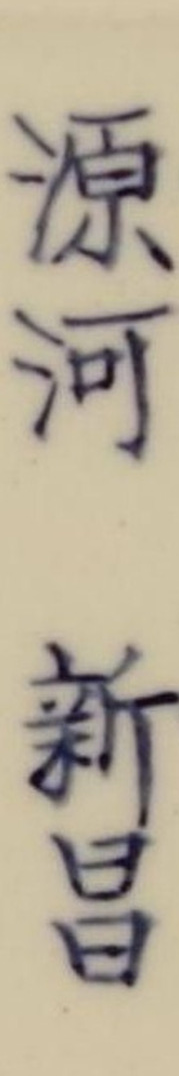源河新昌
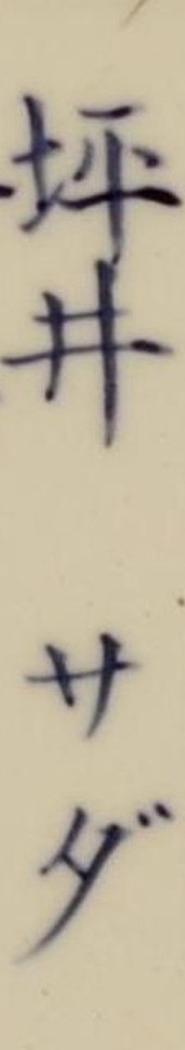坪井サダ
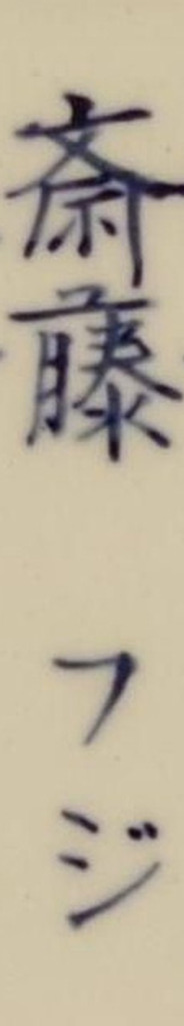斎藤フジ
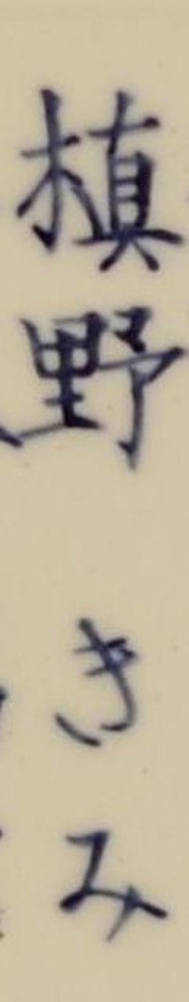植野きみ
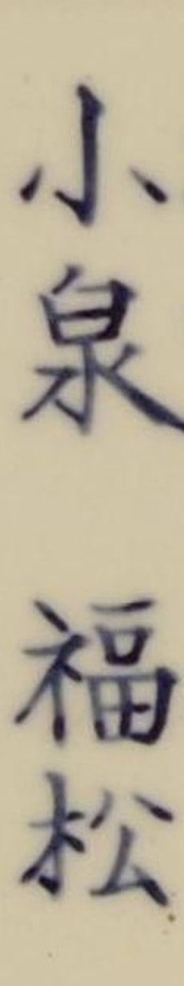小泉福松
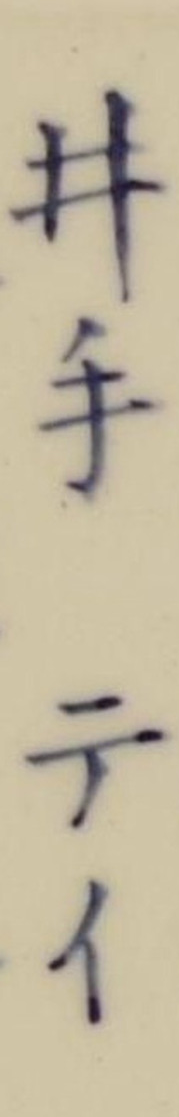井手テイ
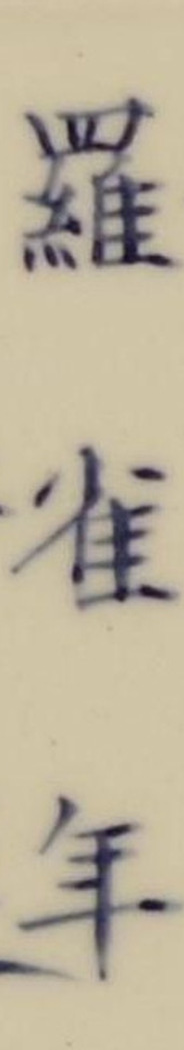羅雀年
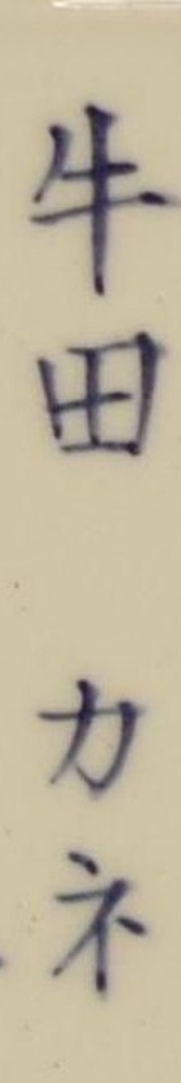牛田カネ
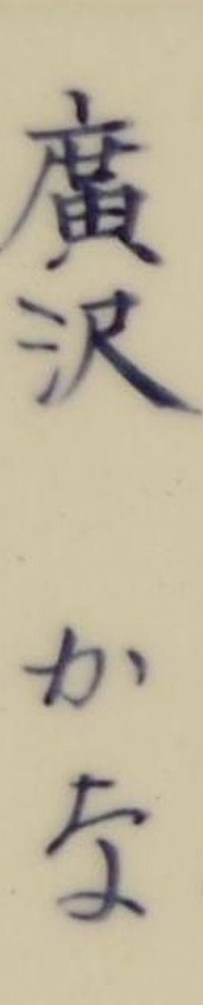廣沢かな
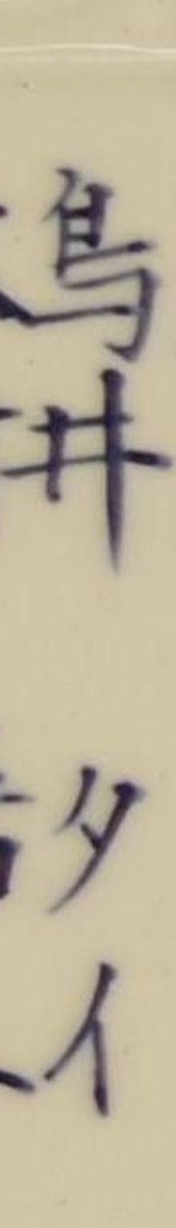鳥井タイ
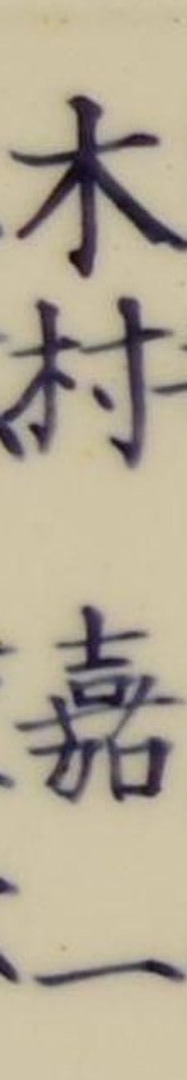木村嘉一

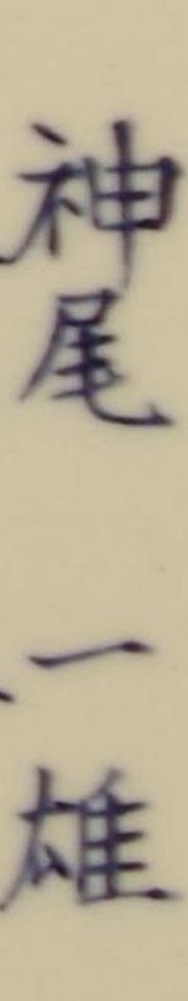神尾一雄
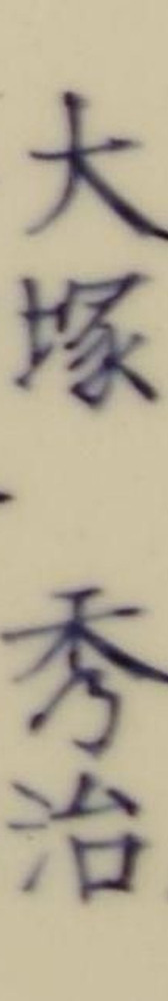大塚秀治
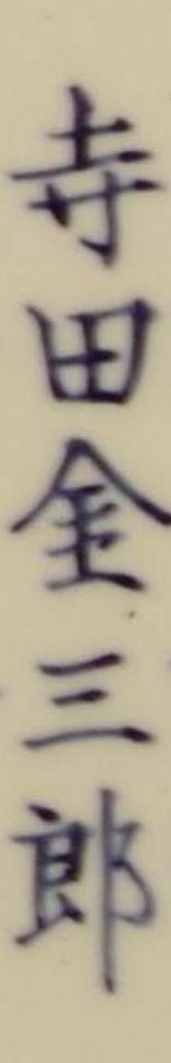寺田金三郎
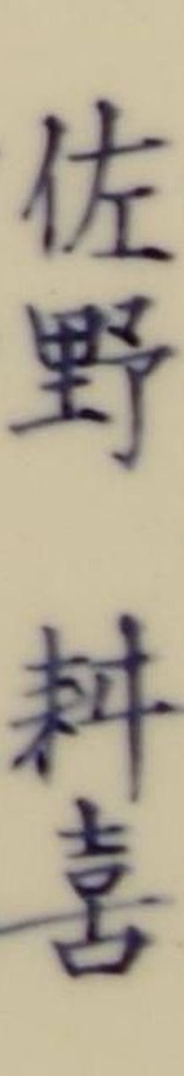佐野耕喜
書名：E~L
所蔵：高野山金剛峯寺
